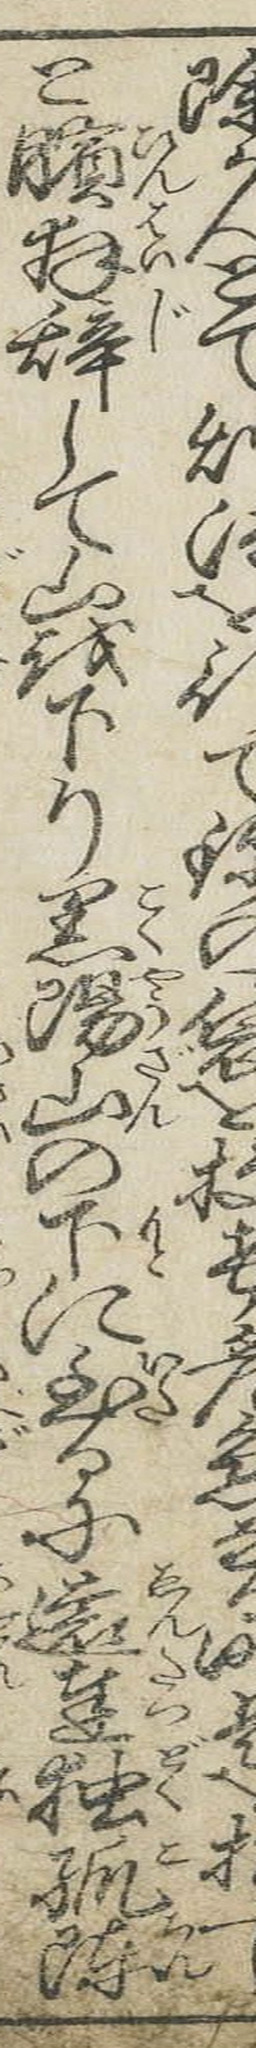と臏拝辞して山を下り黒陽山の下に至るに遠達独孤陳
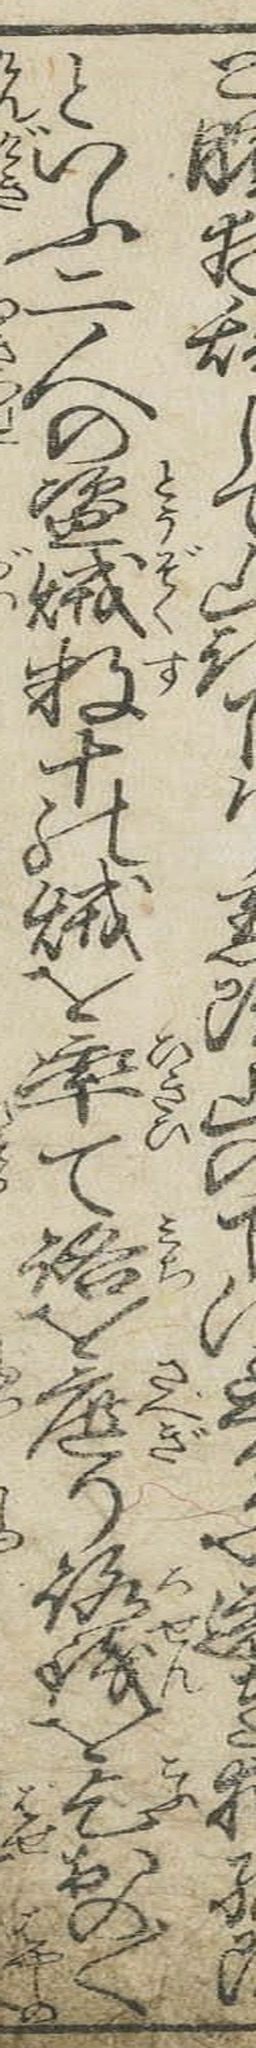といふ二人の盗賊数十の賊を率て路を遮り路銭を乞おの〳〵
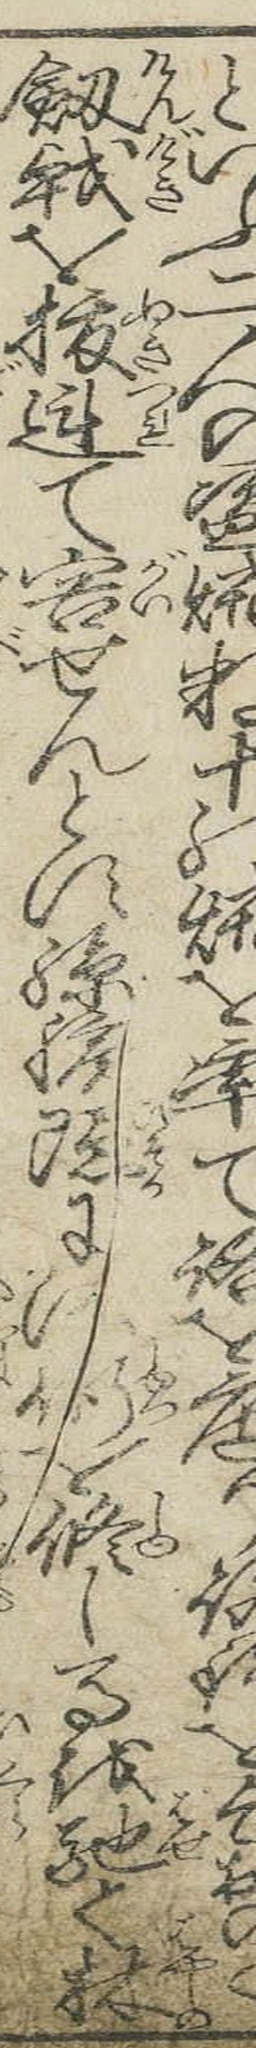剣戟を抜連て害せんとす孫臏隠に法術を修し馬を馳て林
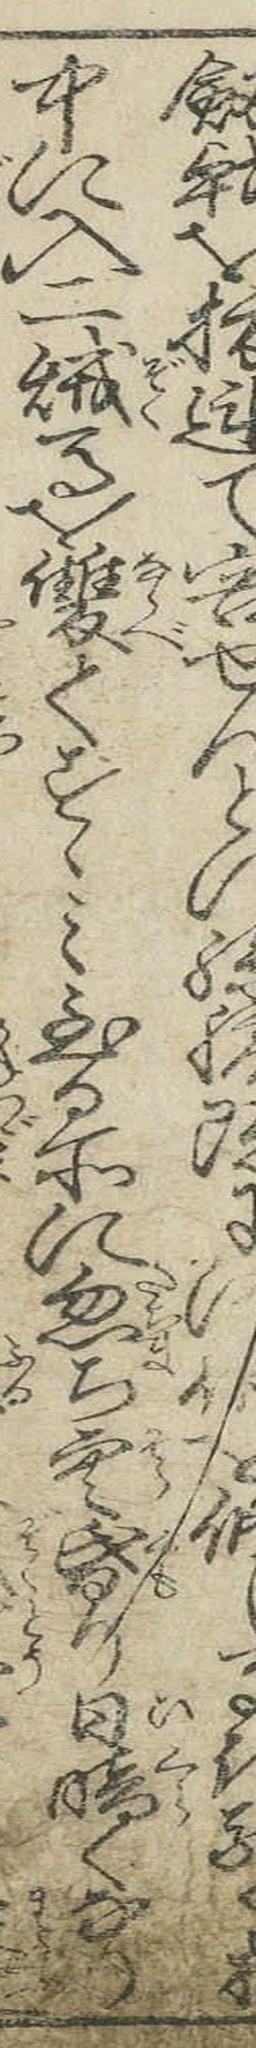中に入二賊馬を双てすゝみ至る所に忽ち空昏り日暗くなり
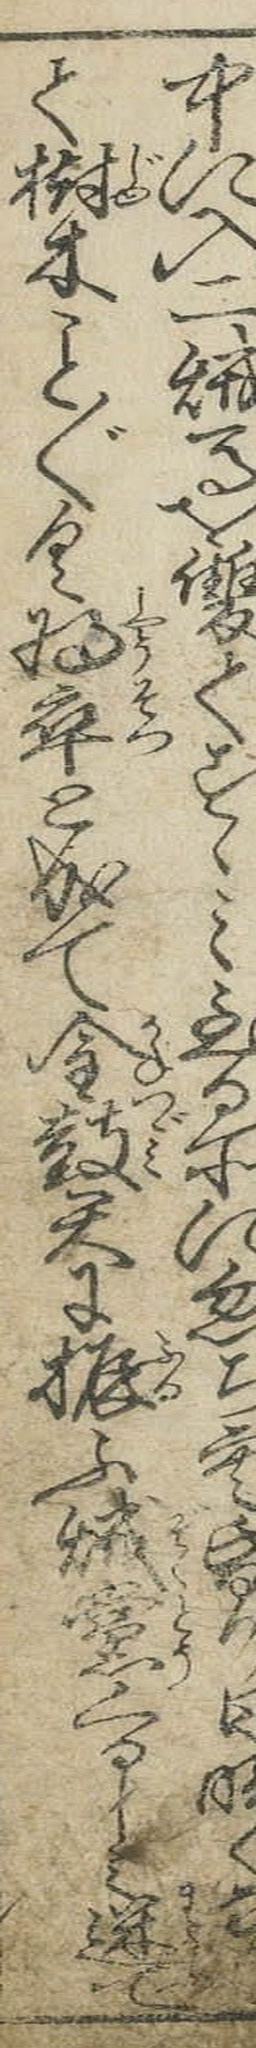て樹木こと〴〵く将卒と成て金鼓天に振ふ賊党くるしみ迷て

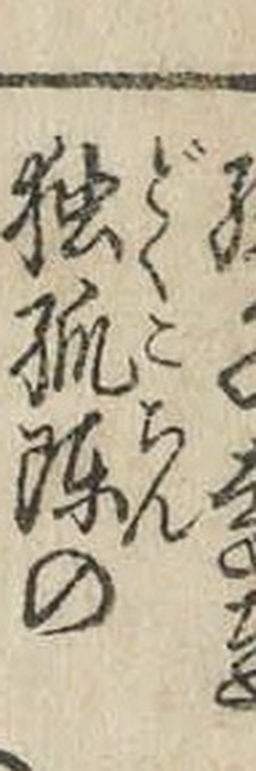独孤陳の
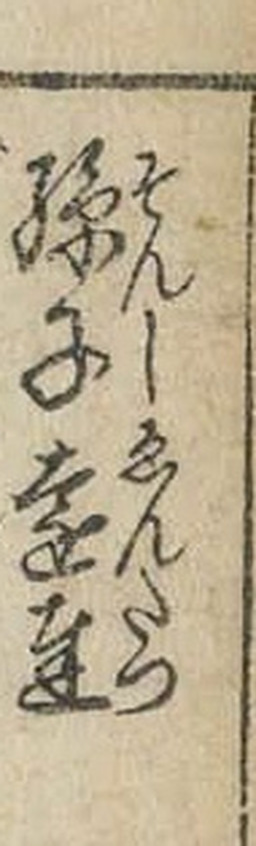孫子遠達

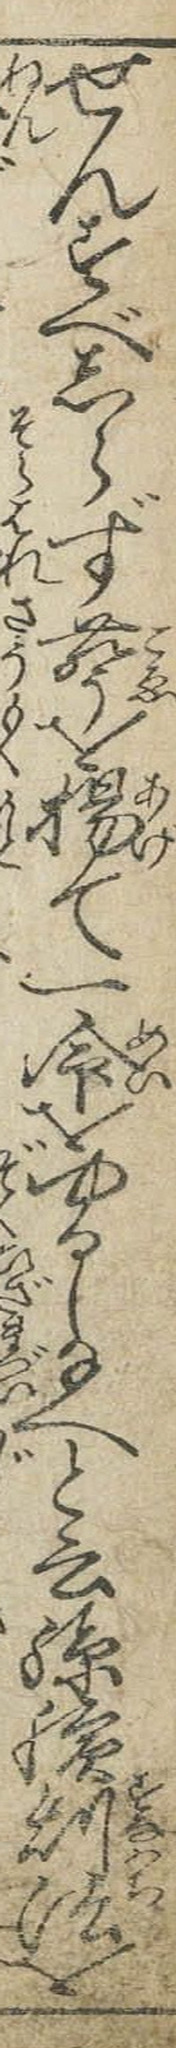せんすべしらず声を揚て一命をゆるし給へと云孫臏則法を
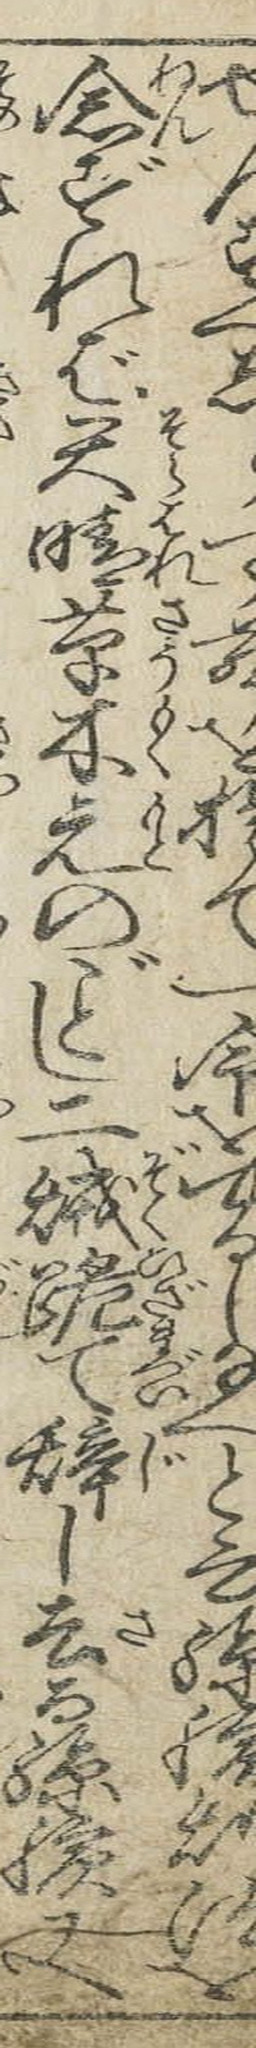念ずれば天晴草木元のごとし二賊跪て辞し去る孫臏又
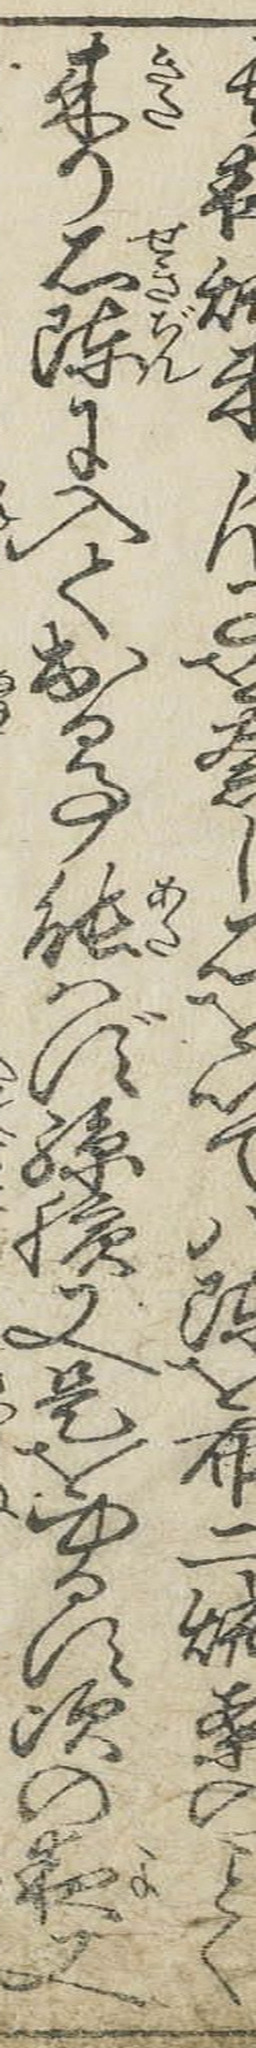来り石陣に入て出る事能はず孫臏又是をゆるす次の夜又
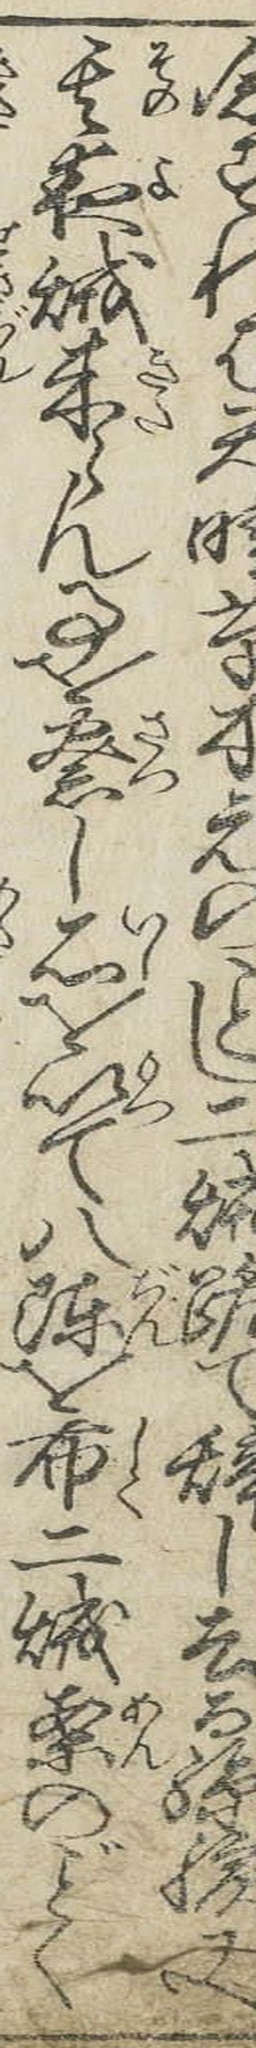其夜賊来らん事を察し石を以て八陣を布二賊案のごとく
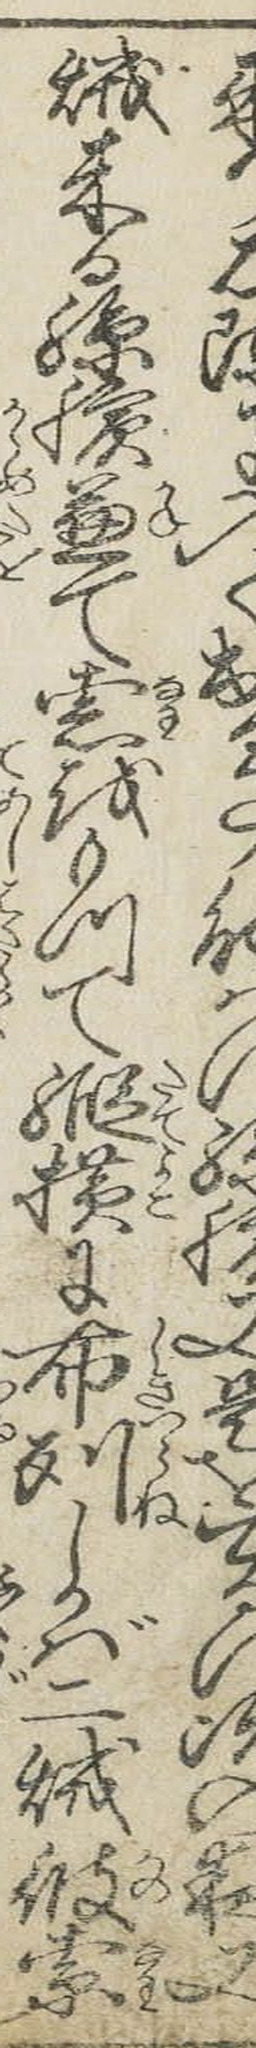賊来る孫臏兼て索をもつて縦横に布列しかば二賊彼索
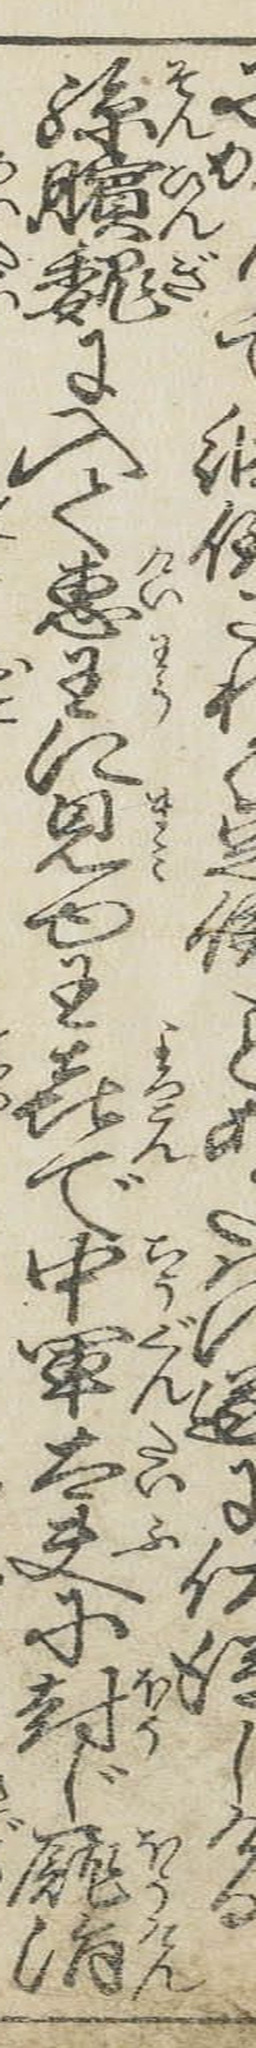孫臏魏に入て恵王に見ゆ王喜で中軍太夫に封じ龐涓
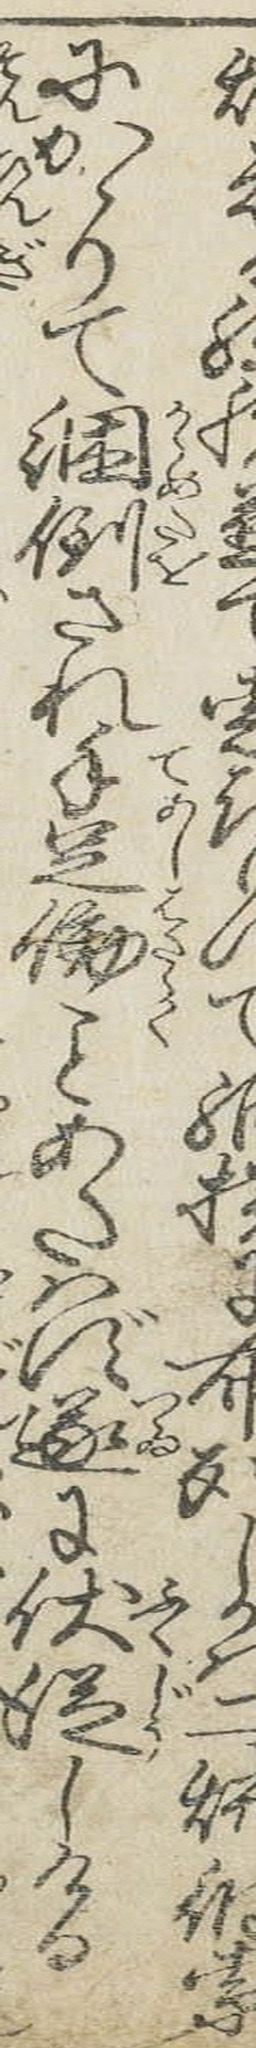にかゝりて綑倒され手足働ことあたはず遂に伏従しける
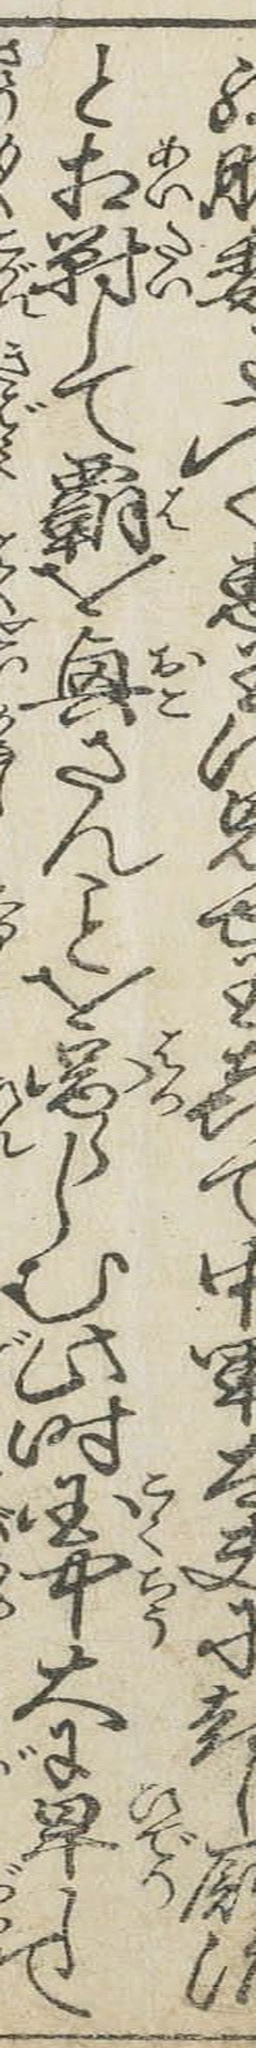と相対して覇を興さんことを図らしむ此時国中大に旱して
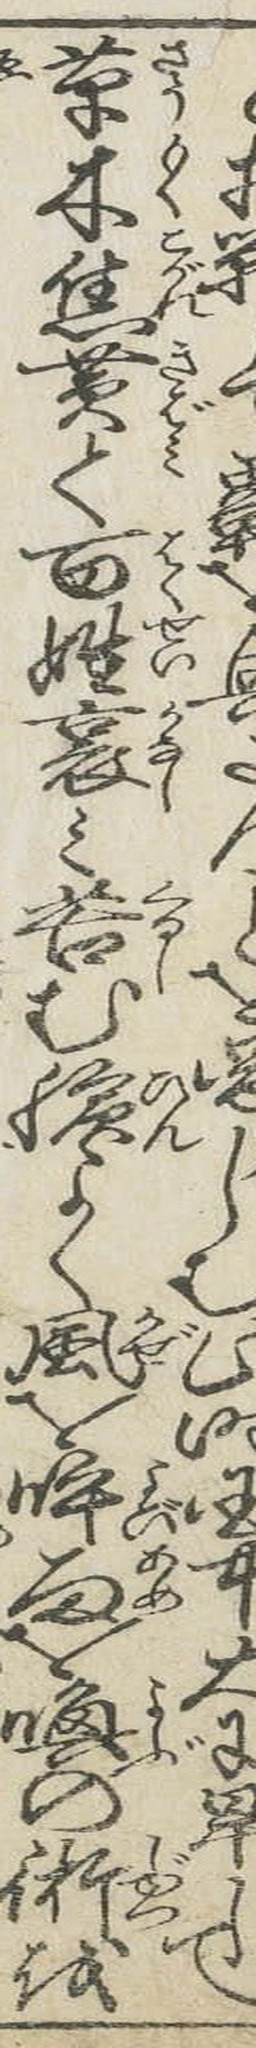草木焦黄て百姓哀み苦む臏よく風を呼雨を喚の術を
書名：絵本写宝袋 9巻 6之巻
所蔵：東京学芸大学教育コンテンツアーカイブ
